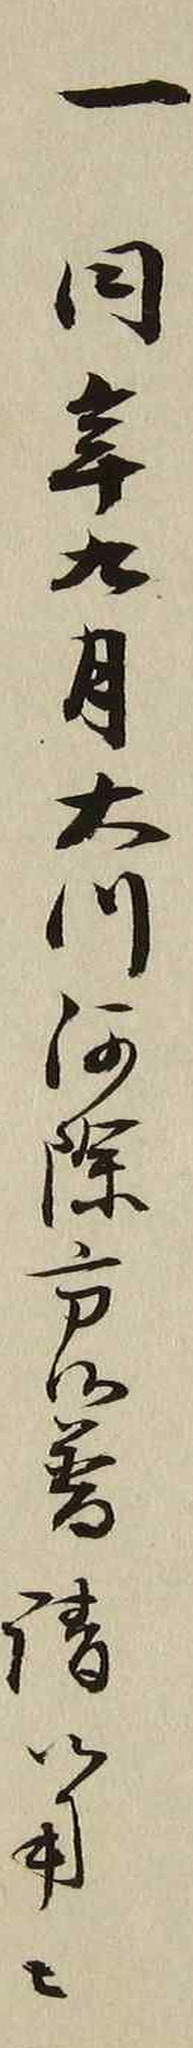一同年九月大川河除方御普請御用被
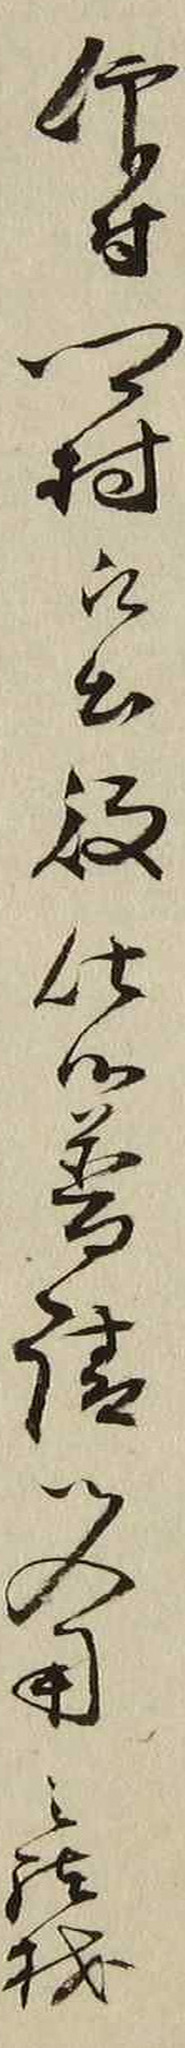仰付郷村江出役仕御普請御用之諸材
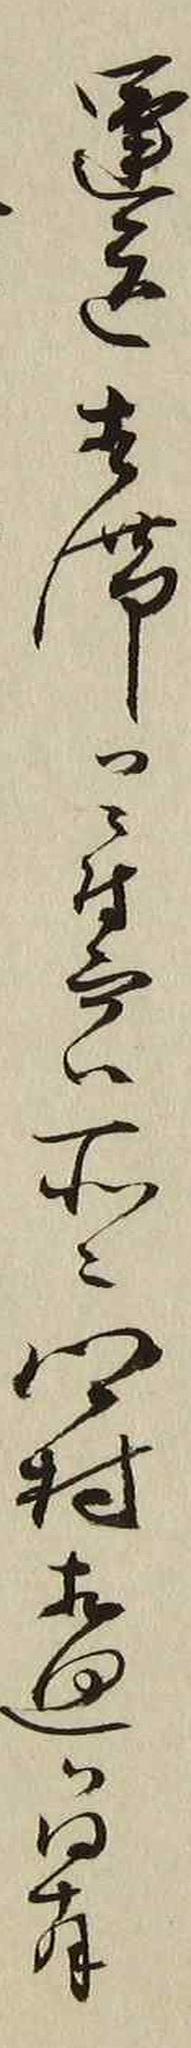運送相滞候ニ付而ハ所々郷村相廻り同十月
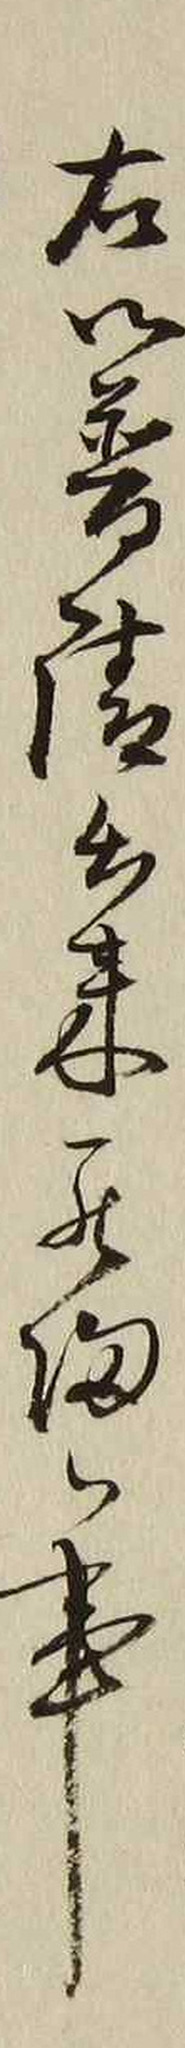右御普請出来罷帰候事
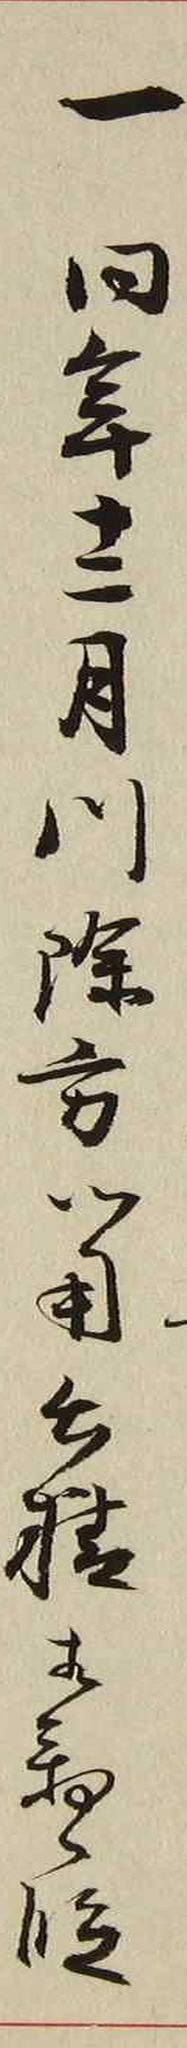一同年十二月川除方御用出精相勤候段
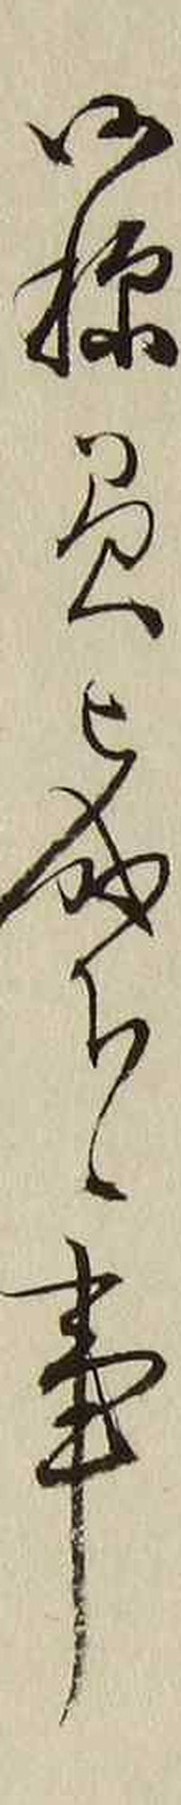御称美被成下候事
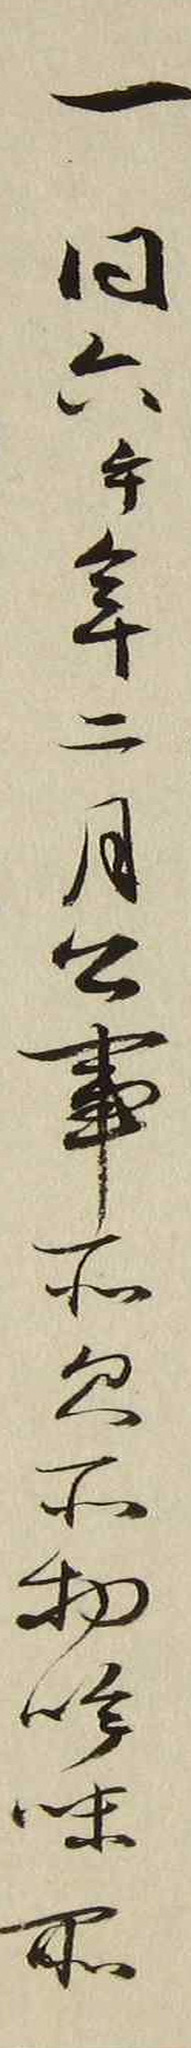一同六午年二月公事所欠所物吟味所
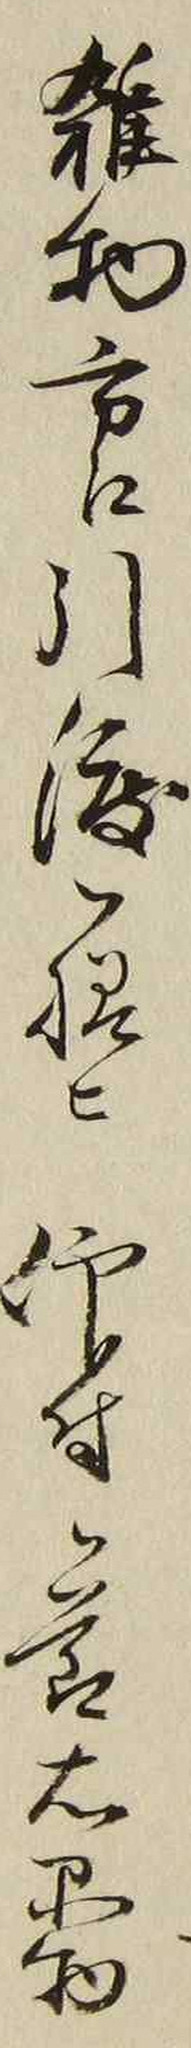雑物方江引渡候様被仰付候節右品物
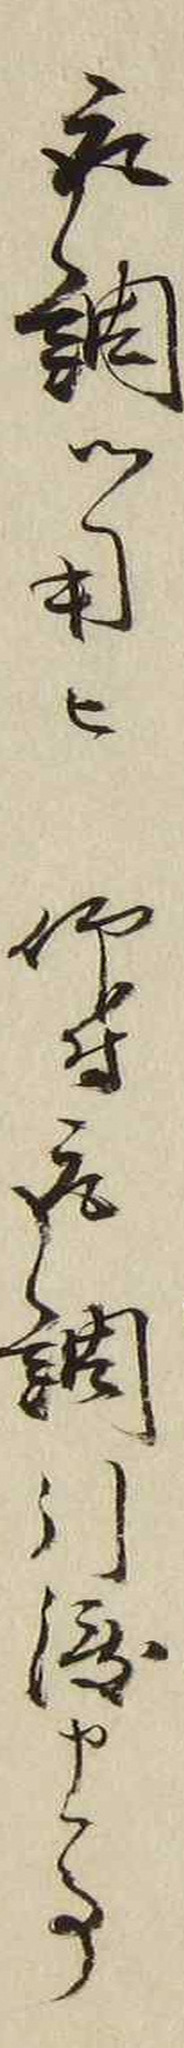取調御用被仰付取調引渡申候事
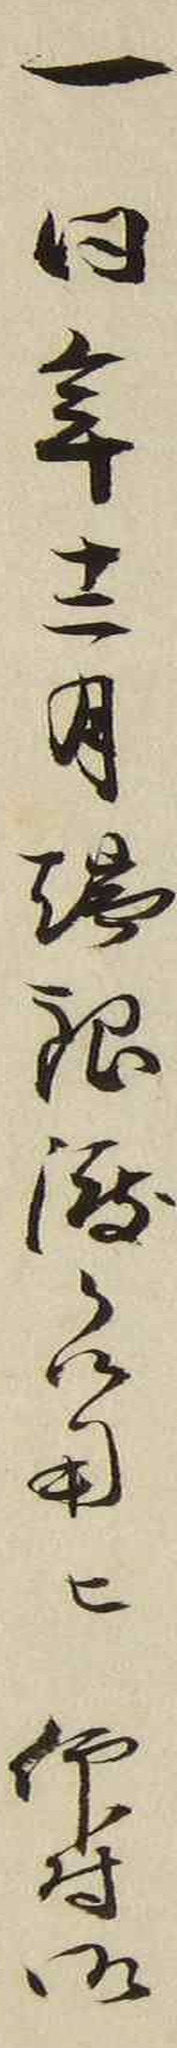一同年十二月端銀渡り御用被仰付御

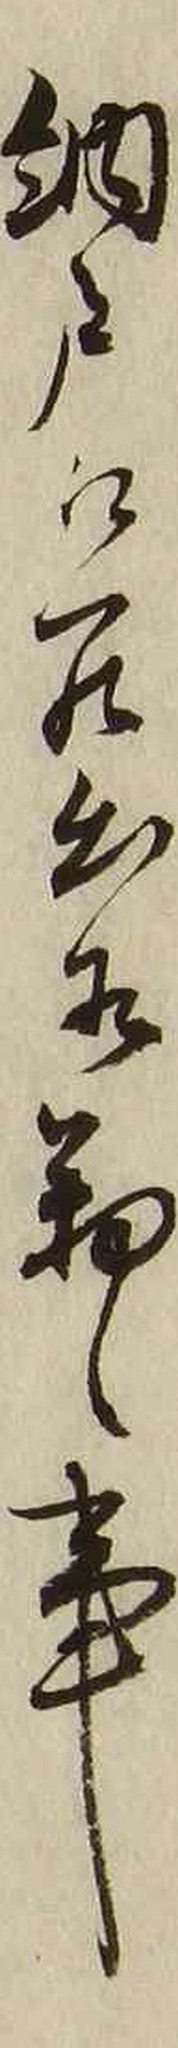納戸江罷出相勤候事
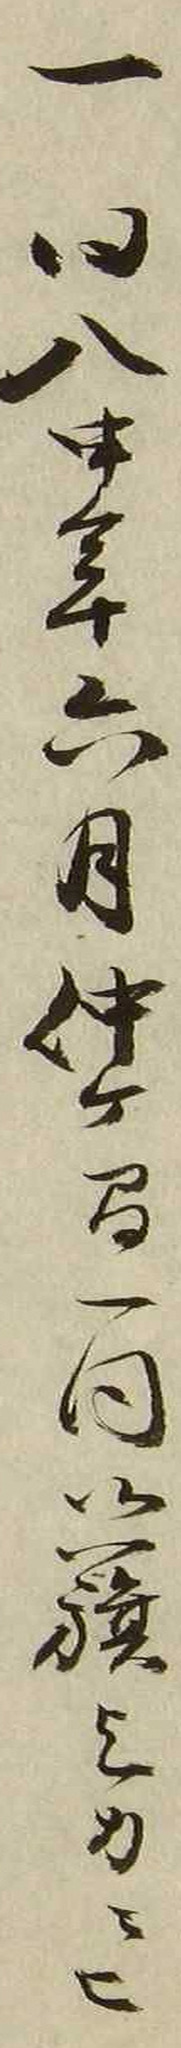一同八申年六月仲ヶ間一同御旗与力ニ被
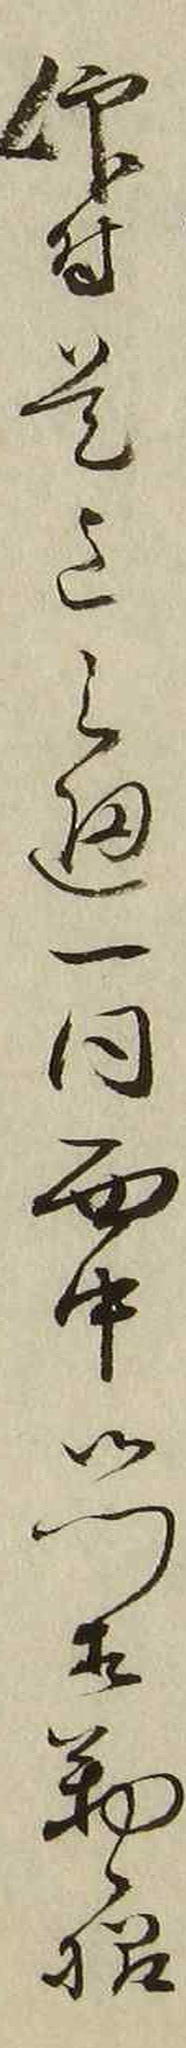仰付是迄之通一同西中御門相勤候様
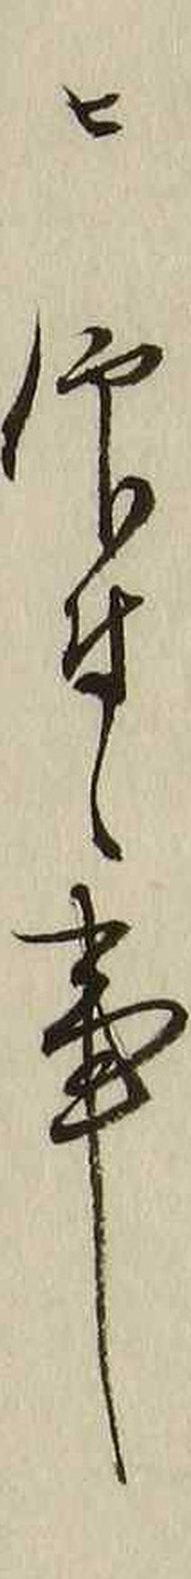被仰付候事
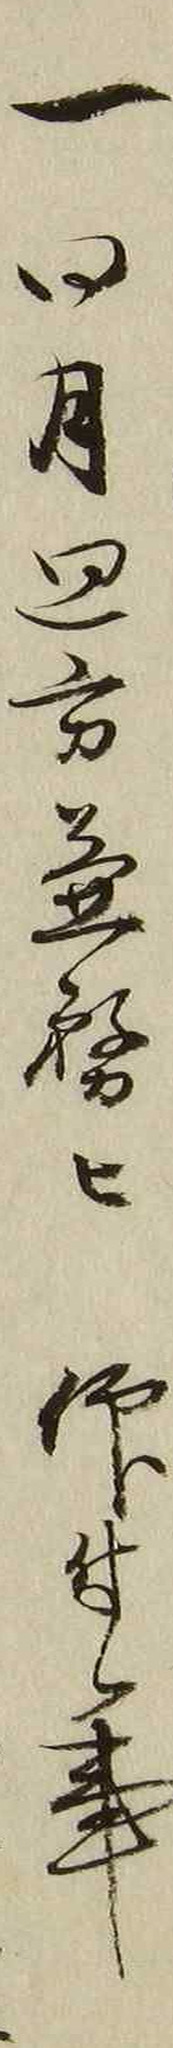一同月廻方兼務被仰付候事
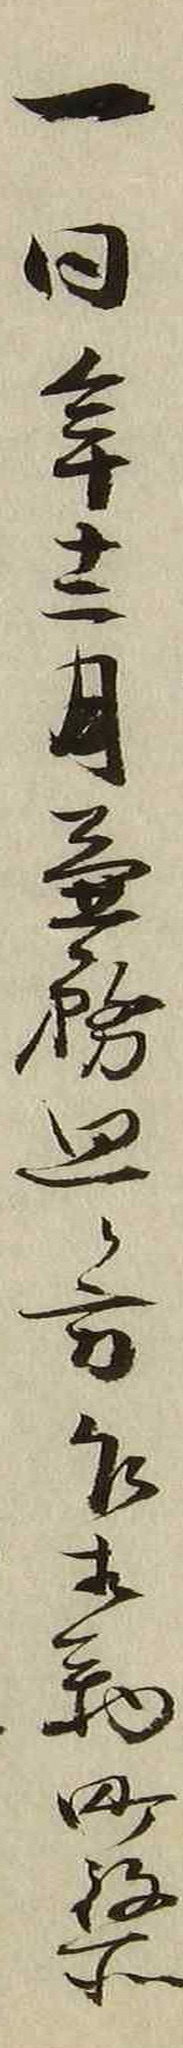一同年十二月兼務廻り方乍相勤町役所
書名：諸士系譜　巻之291　さ之部23
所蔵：会津若松市立会津図書館
